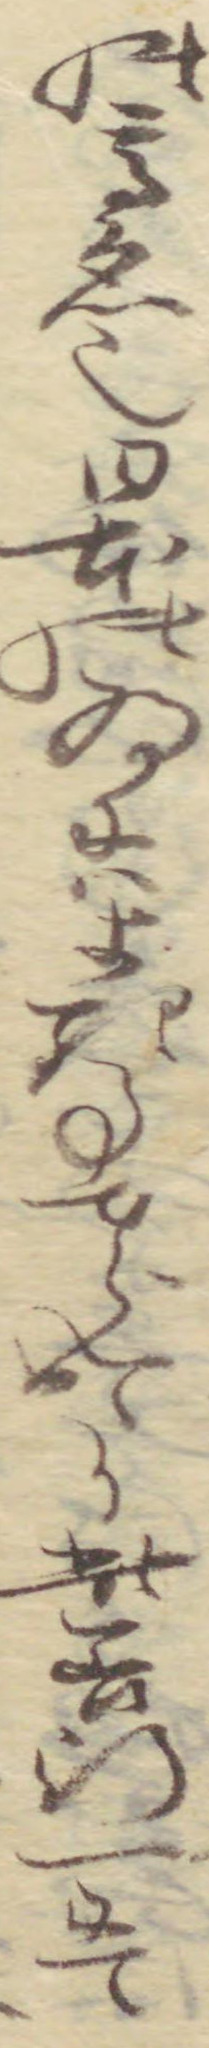の高名也日本の為にはよき事を被成たり此善行一にて
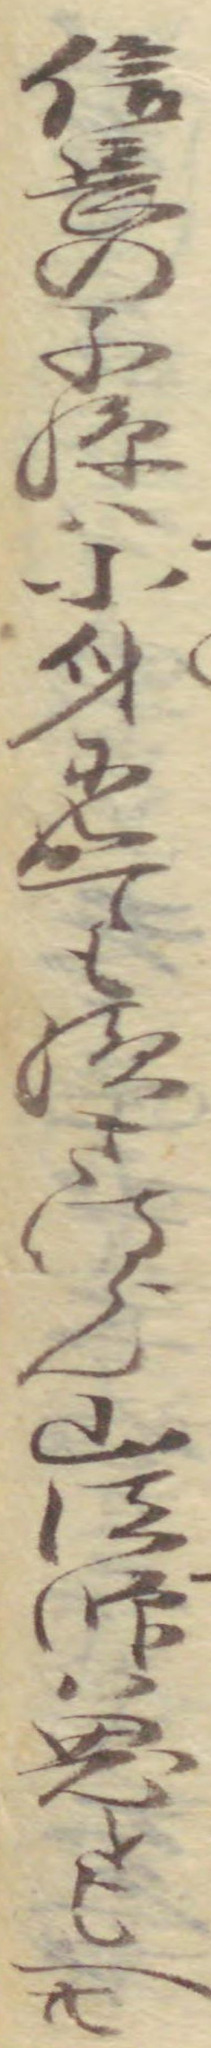信長の子孫は小身に成ても続き侍らん山法師は鬼と申候へ共
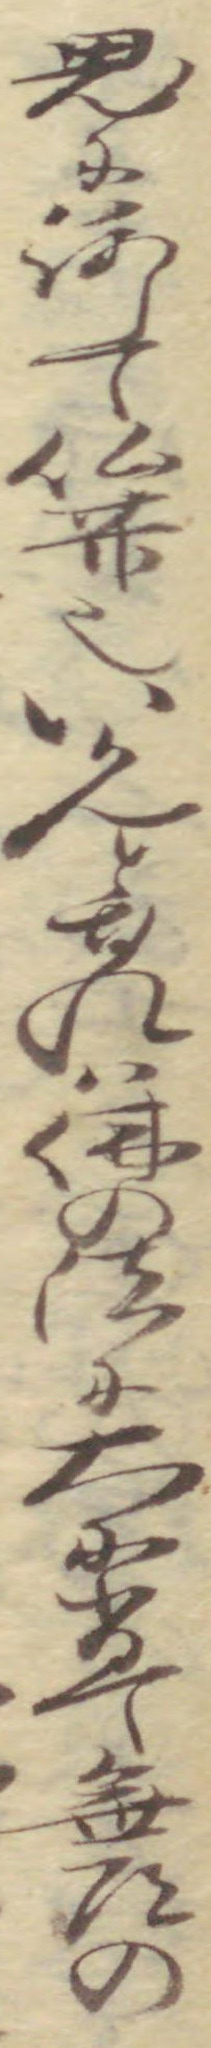鬼にはあらて仏菩薩也いかんとなれは仏の法に大に背て無道の
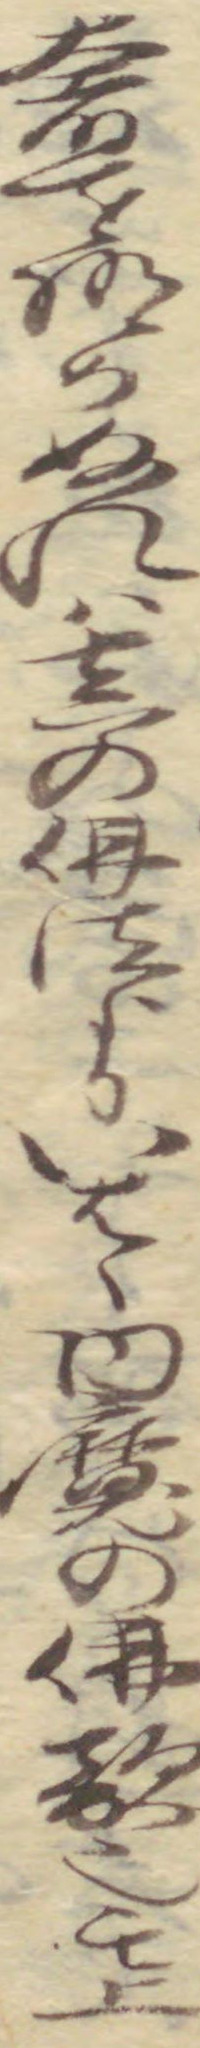奢を極めぬれは真の仏法よりいはゝ内魔の仏敵也其上
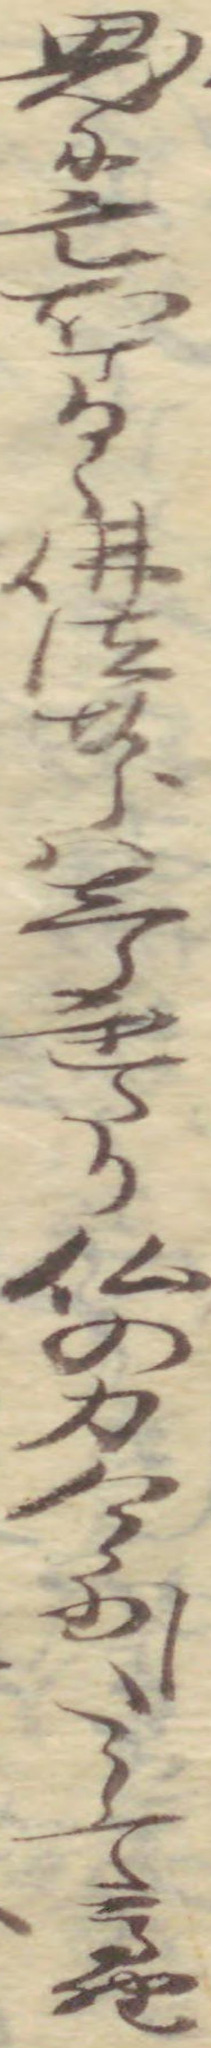鬼に亡ほさるゝ仏法ならはしられたり仏の力今少したらて高野
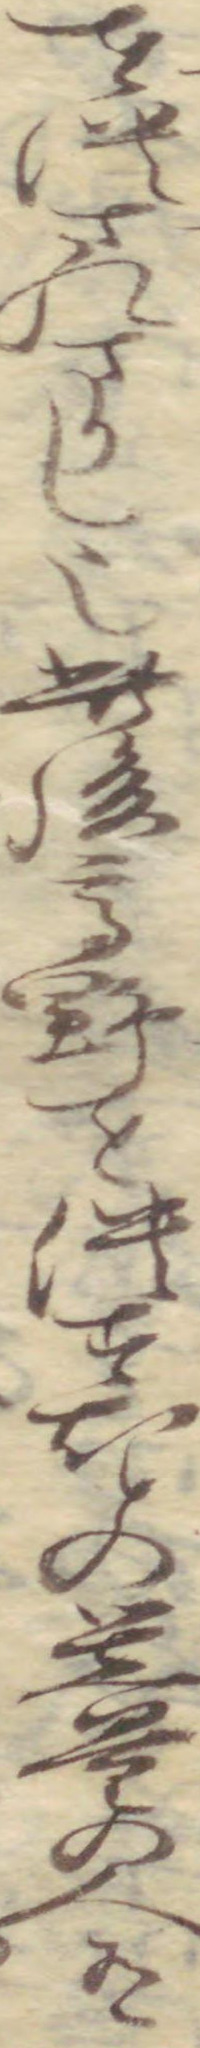を潰されさりし也此後高野を潰すほとの器量の人有
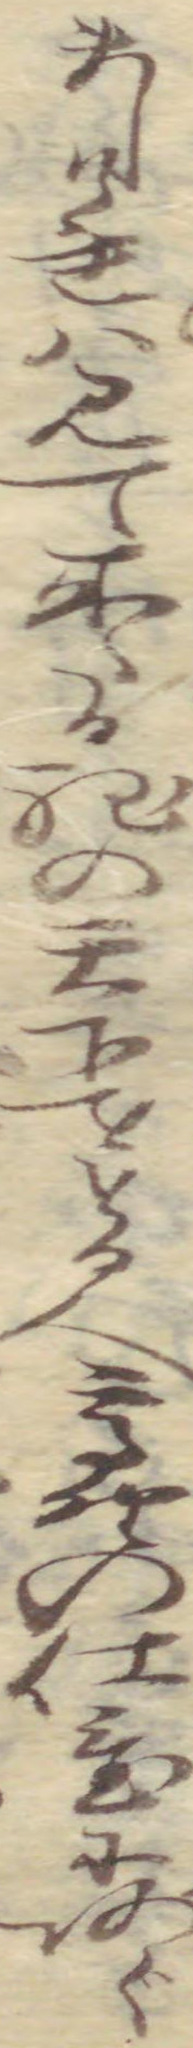ましけれは見て来たる程の天下をとる人高野の仕置にあぐ
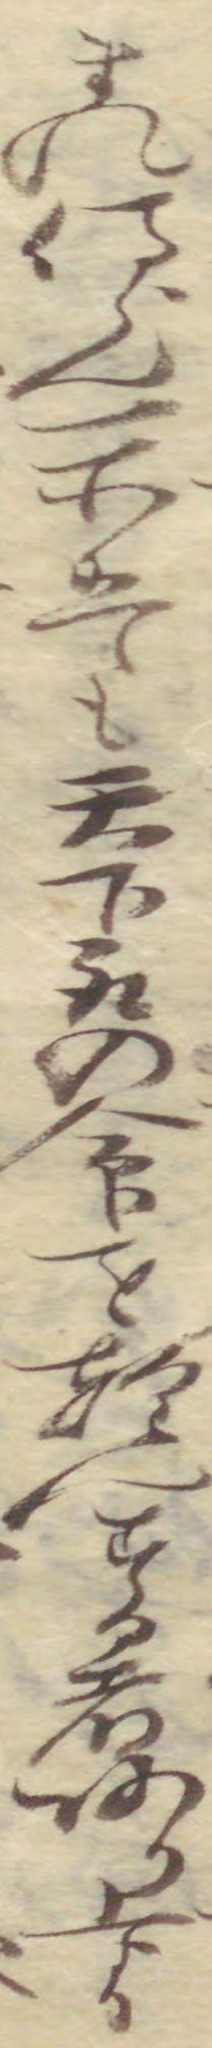まれ侍らん一所にても天下取の命を軽んする者あり上より
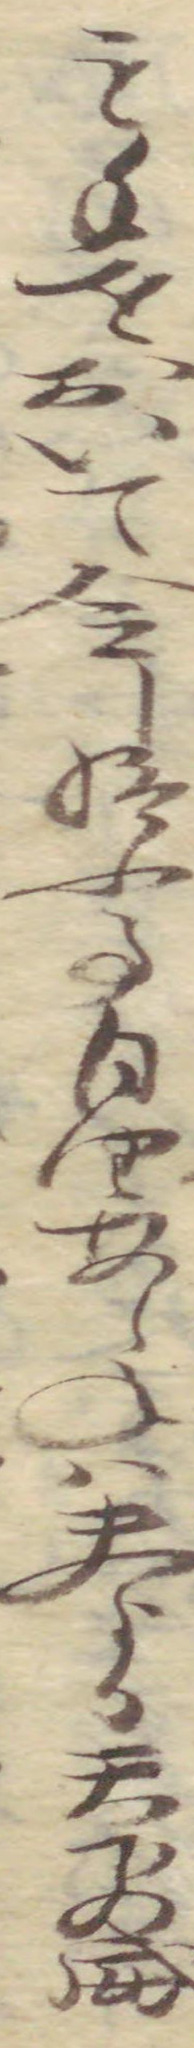も手をおいて令し給ふ事自由ならねは夫より天下の威
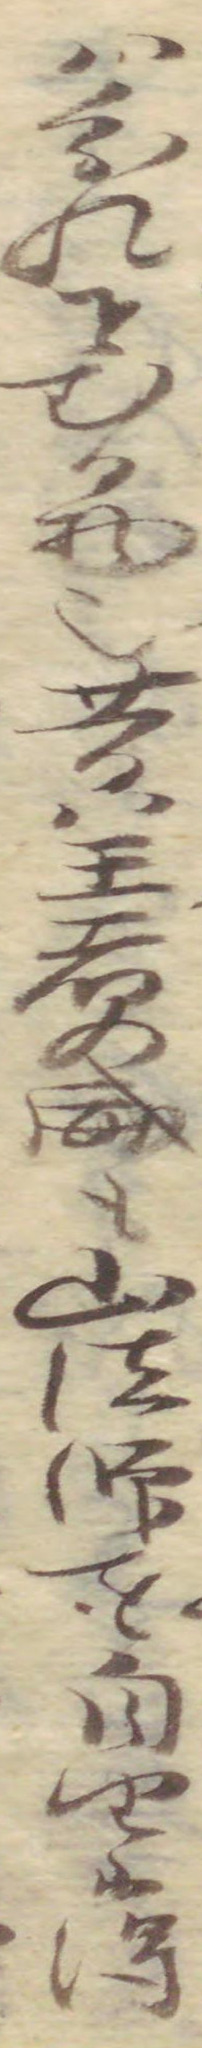は分れそむる物也昔は王者の威も山法師を自由に得
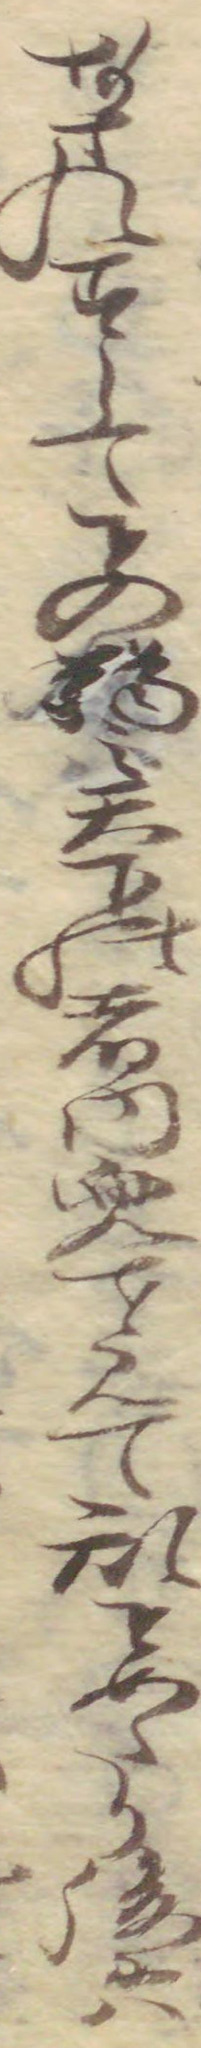なされすしてその弱み天下の者内兜を見て乱そめたり後には
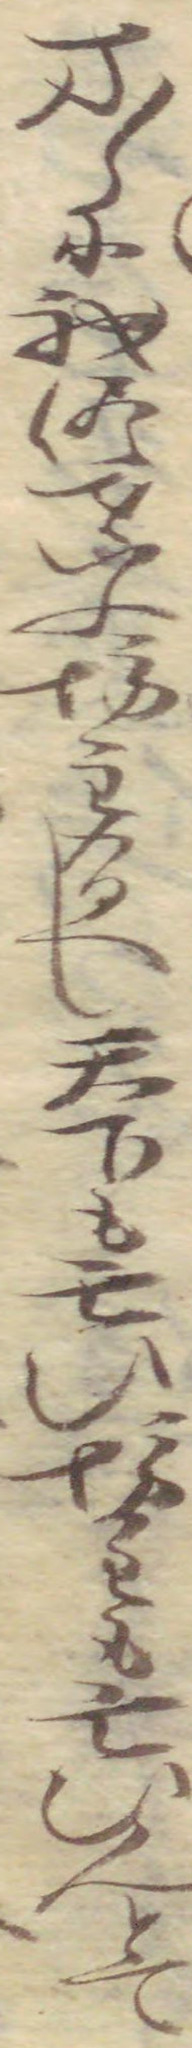方〳〵に我侭をいふ坊主有へし天下も亡ひ坊主も亡ひんとて
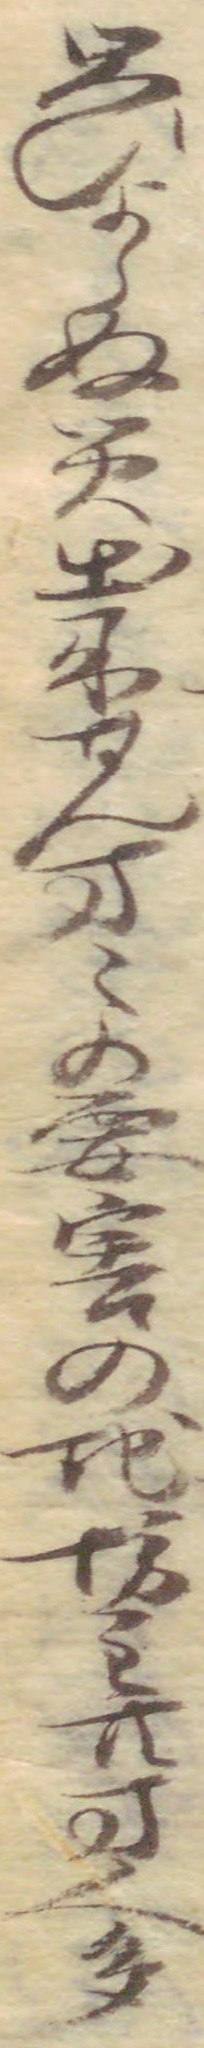思ひよらぬ災出来なん方〻この要害の地坊主共方へ多

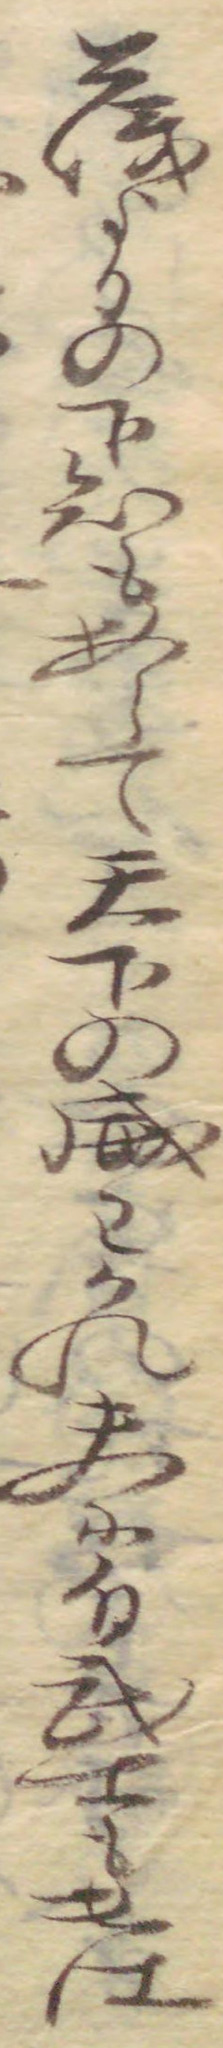公儀よりの下知もならて天下の威わかれ夫に付武士も出仕
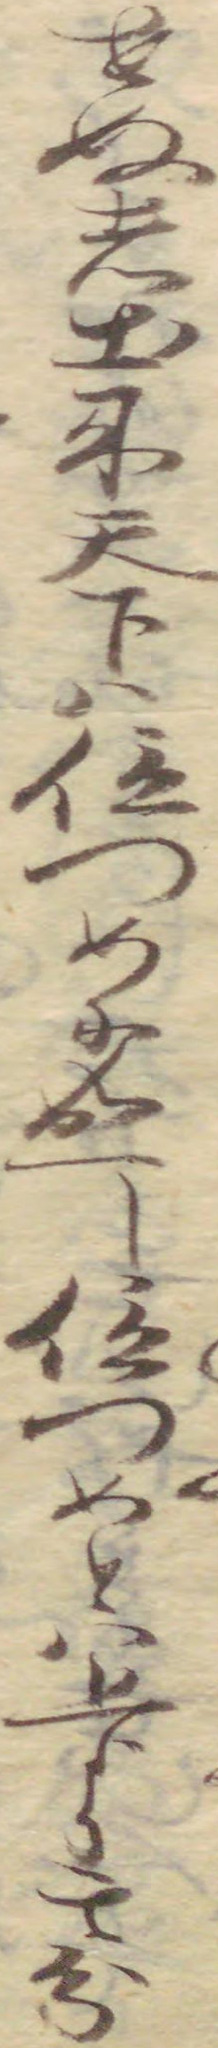せぬ者出来天下は位つめに成へし位つめとは上より其分
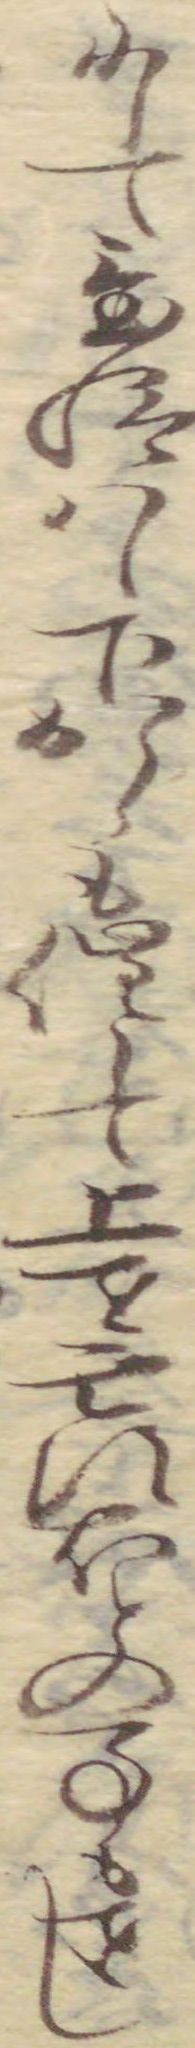にして置給はゝ下からも催して上を亡すほとの事もせし
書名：鶯宿雑記. 巻263-264
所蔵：国立国会図書館 National Diet Library, JAPAN
